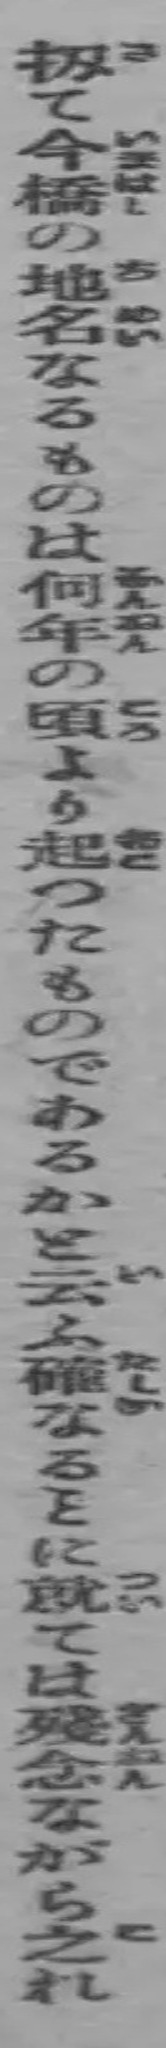扨て今橋の地名なるもの何年の頃より起つたものであるかと云ふ確なることに就ては残念なが之れ
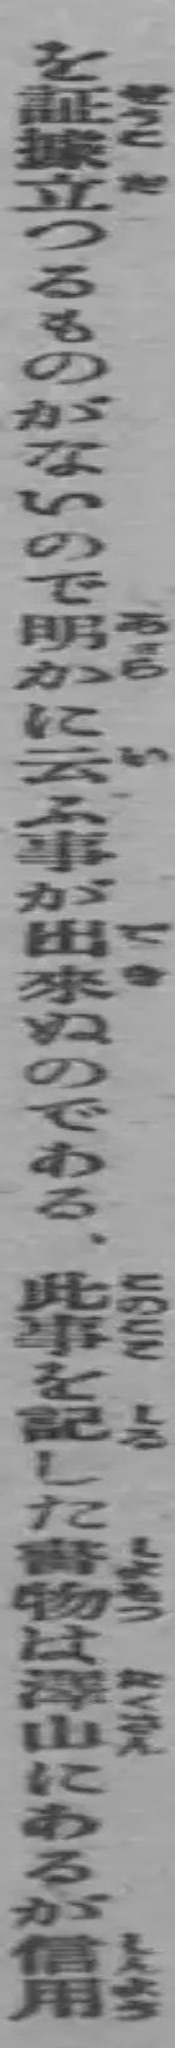を証拠立つるものがないので明かに云ふ事が出来ぬのである、此事を記した書物は沢山にあるが信用
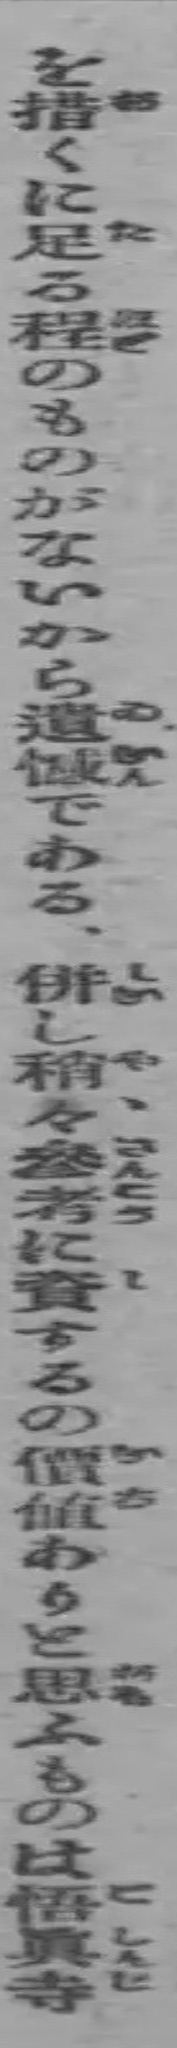を措くに足る程のものがないから遺憾である、併し稍々参考に資するの価値ありと思ふものは悟眞寺
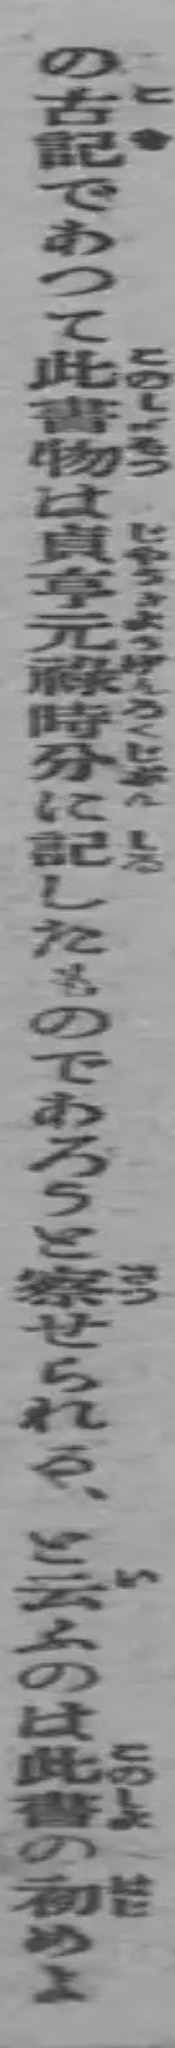の古記であつて此書物は貞享元禄時分に記したものであろうと察せられる、と云ふのは此書の初めよ
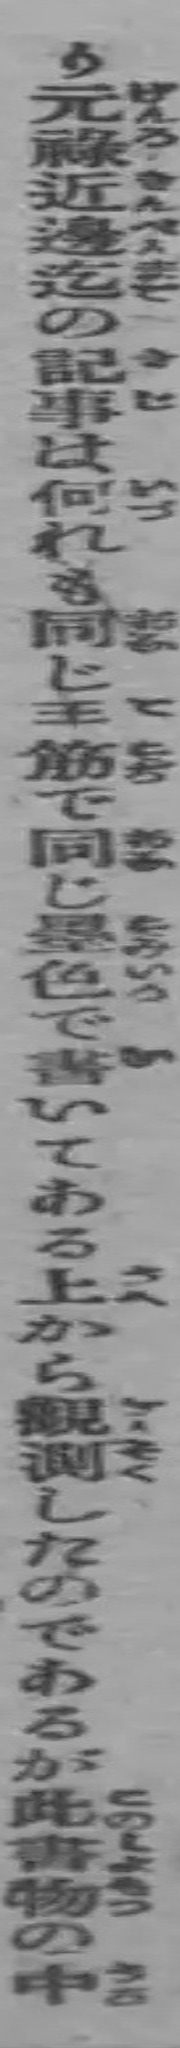り元禄近辺迄の記事は何れも同じ手筋で同じ墨色で書いてある上から観測したのであるが此書物の中
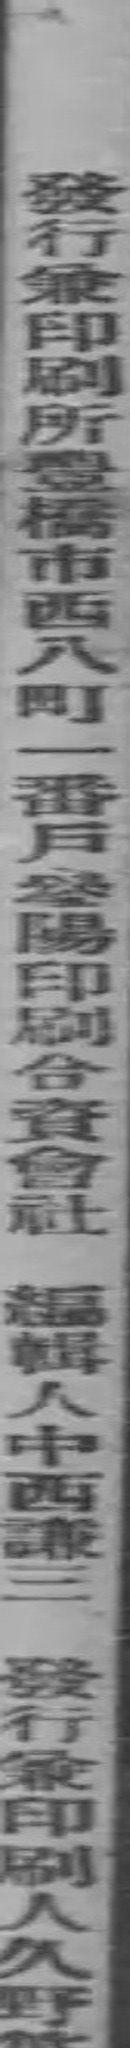発行兼印刷所豊橋市西八町一番戸参陽印刷合資会社編輯人中西謙三発行兼印刷人久野笹吉
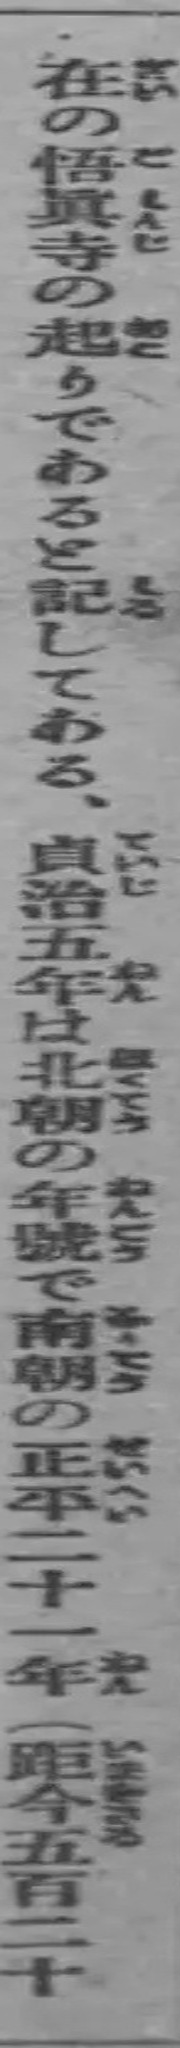在の悟眞寺の起りであると記してある、貞治五年は北朝の年号で南朝の正平二十一年(距今五百二十
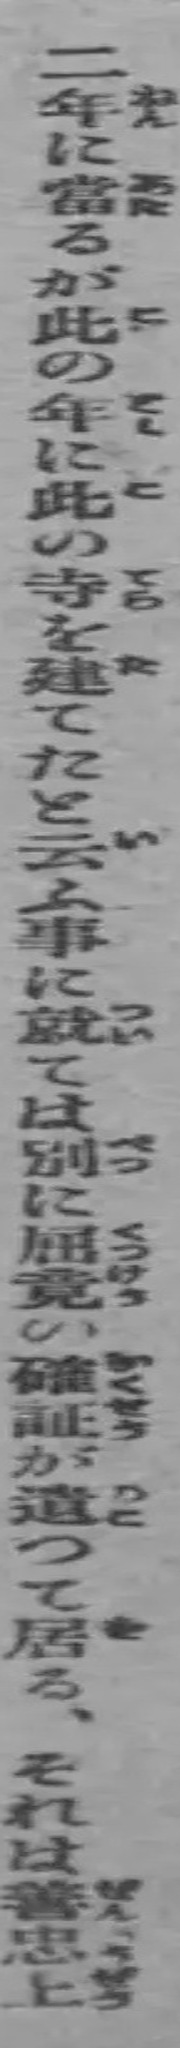二年に当るが此の年に此の寺を建てたと云ふ事に就ては別に屈竟の確証が遺つて居る、それは善忠上
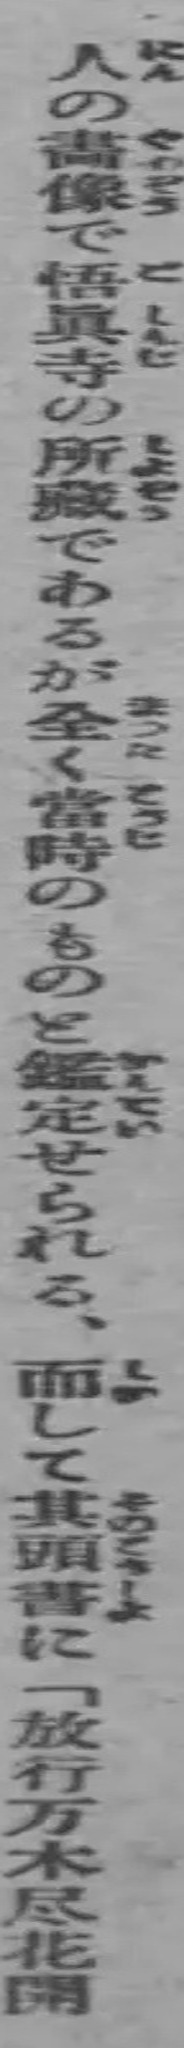人の画像で悟眞寺の所蔵であるが全く当時のものと鑑定せられる、而して其頭書に「放行万木尽花開
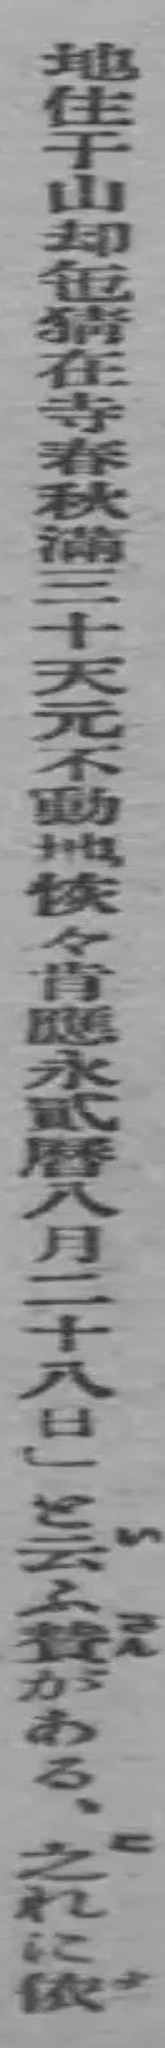地住于山却竾猜在寺春秋満三十天元不動地恢々肯応永貳暦八月二十八日」と云ふ賛がある、之れに依
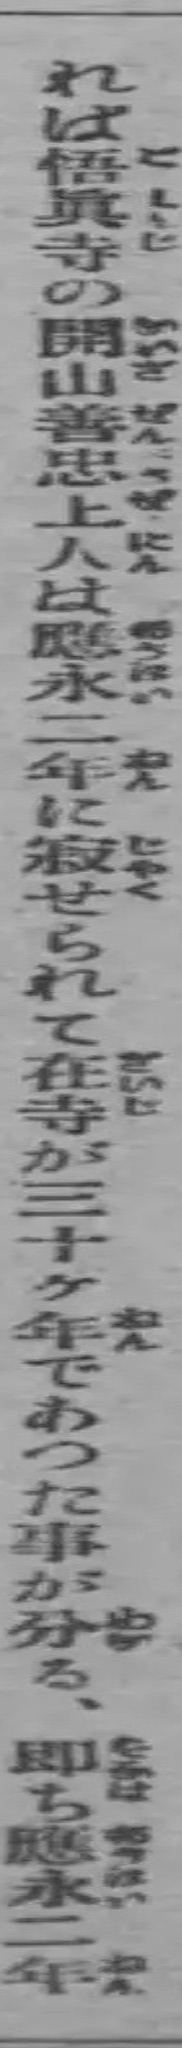れば悟眞寺の開山善忠上人は応永二年に寂せられて在寺が三十ケ年であつた事が分る、即ち応永二年
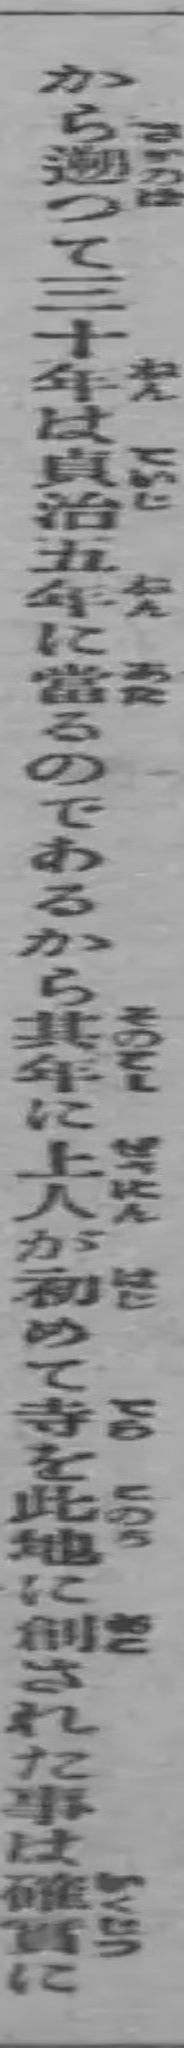から遡つて三十年は貞治五年に当るのであるから其年に上人が初めて寺を此地に創された事は確実に
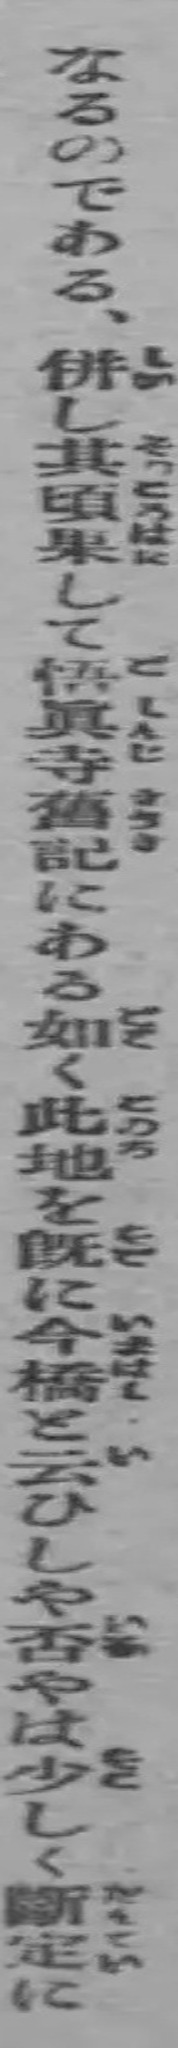なるのである、併し其頃果して悟眞寺旧記にある如く此地を既に今橋と云ひしや否やは少しく断定に
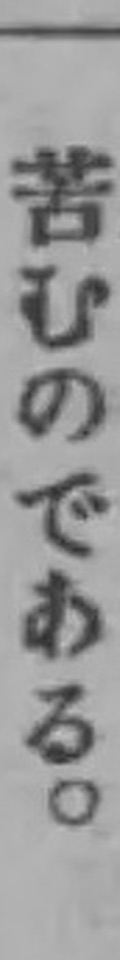苦むのである。
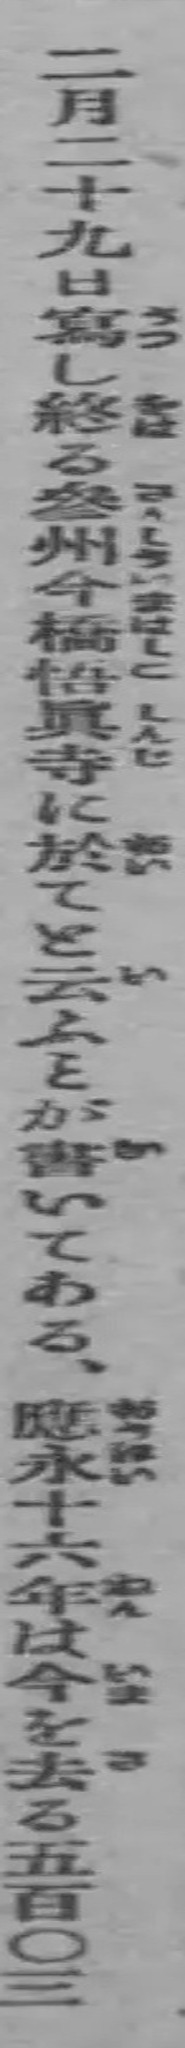経二月二十九日写し終る参州今橋悟眞寺に於てと云ふことが書いてある、応永十六年は今を去る五百〇三
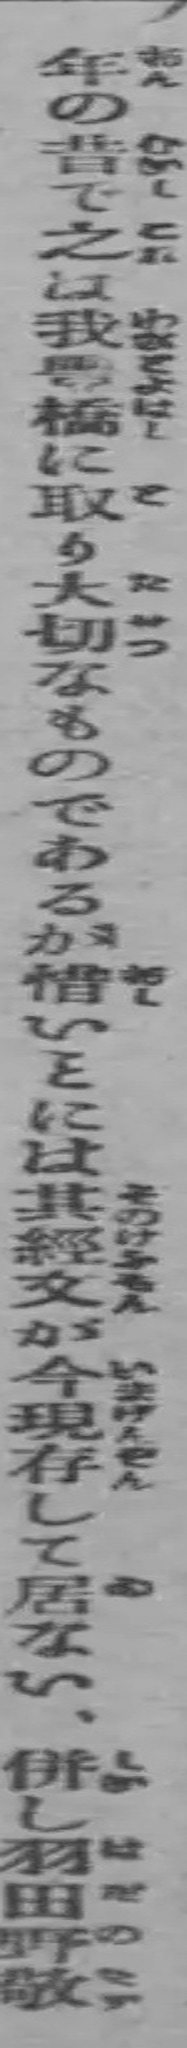年の昔で之は我豊橋に取り大切なものであるが惜いことには其経文が今現存して居ない、併し羽田野敬
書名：豊橋市史談
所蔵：国立国会図書館 National Diet Library, JAPAN
